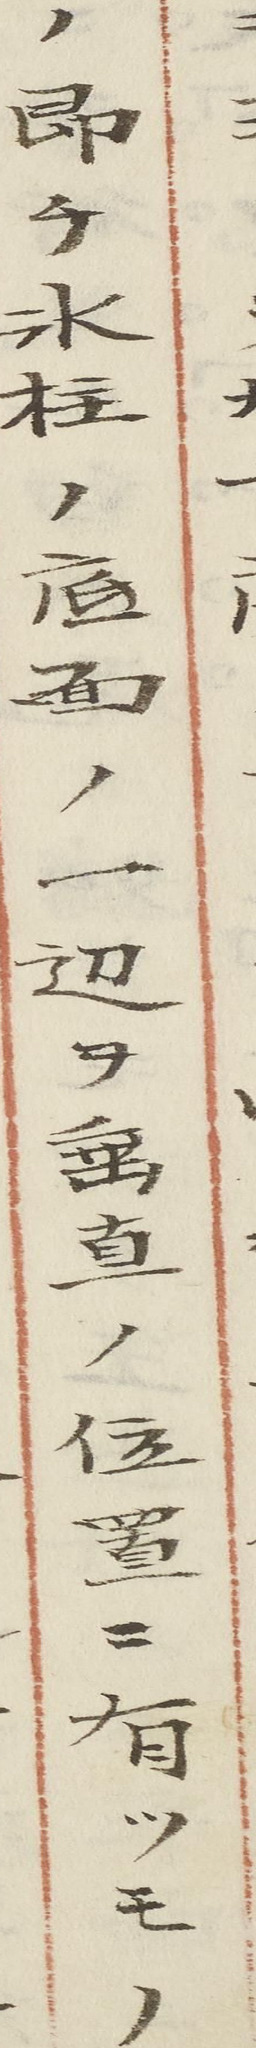ノ即チ氷柱ノ底面ノ一辺ヲ垂直ノ位置ニ有ツモノ
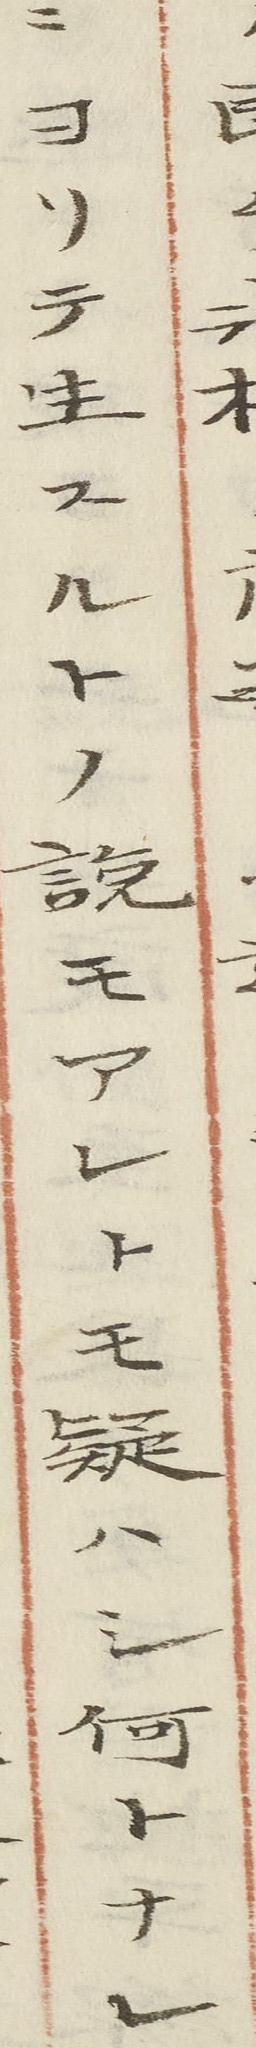ニヨリテ生スルトノ説モアレトモ疑ハシ何トナレ
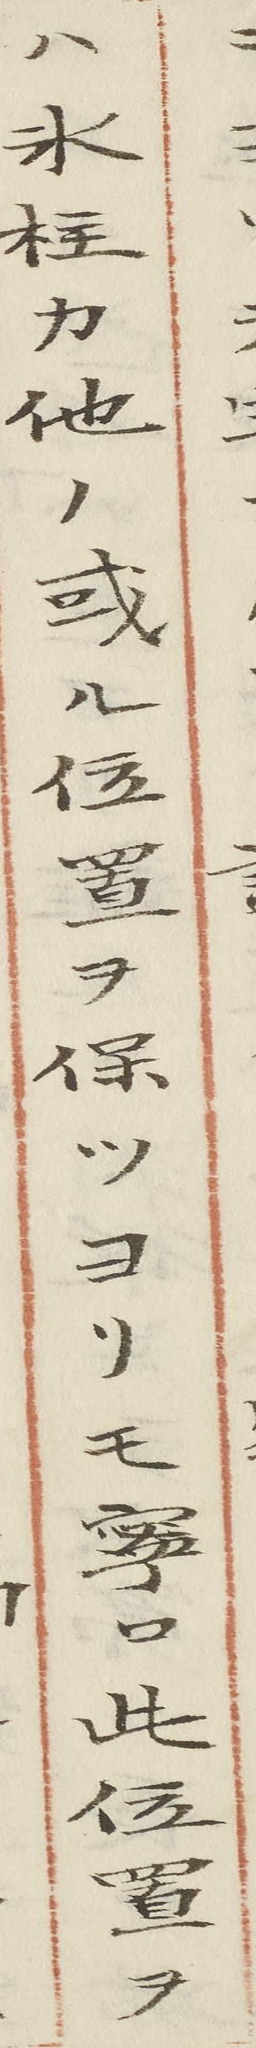ハ氷柱カ他ノ或ル位置ヲ保ツヨリモ寧ロ此位置ヲ
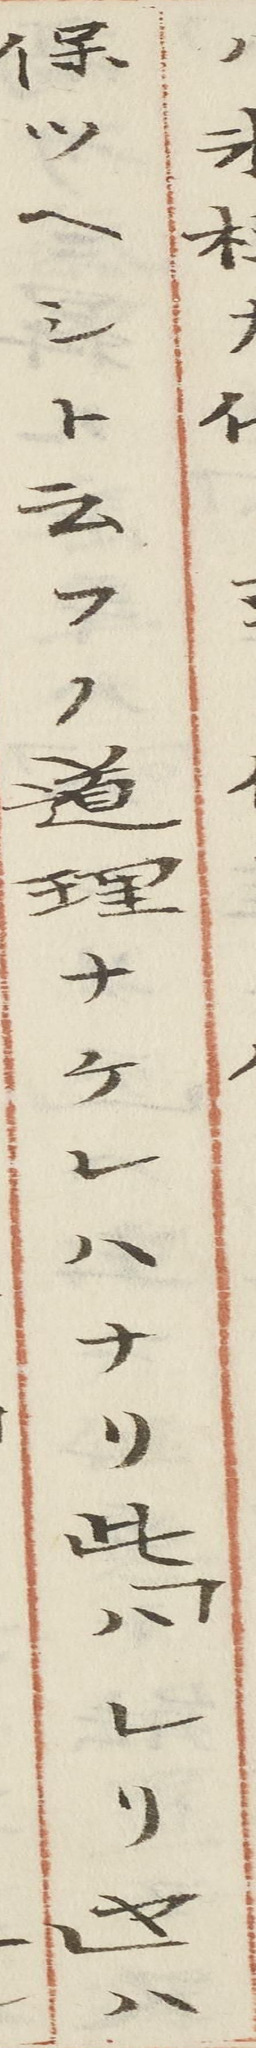保ツヘシト云フノ道理ナケレハナリ此「ハレリヤ」ハ
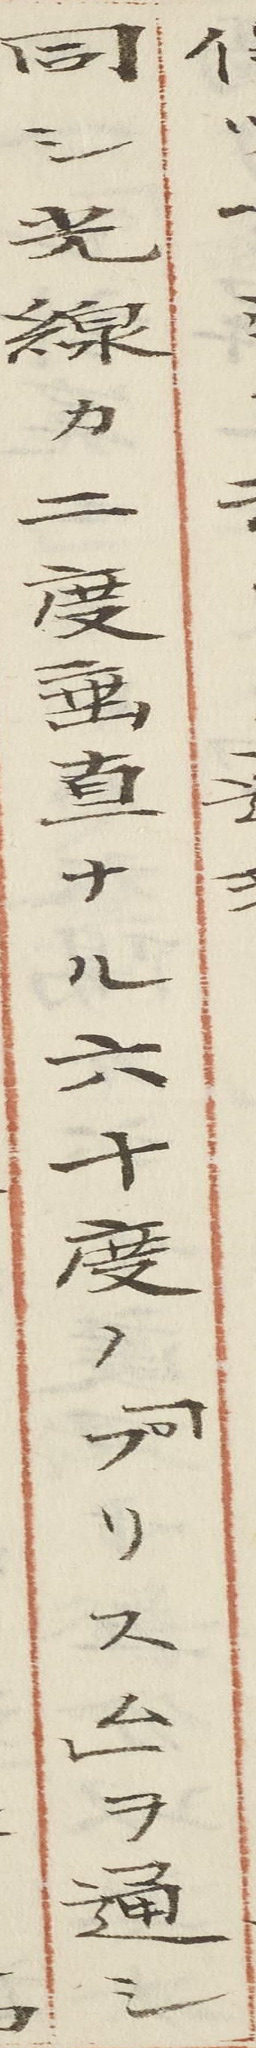同シ光線カ二度垂直ナル六十度ノ「プリスム」ヲ通シ
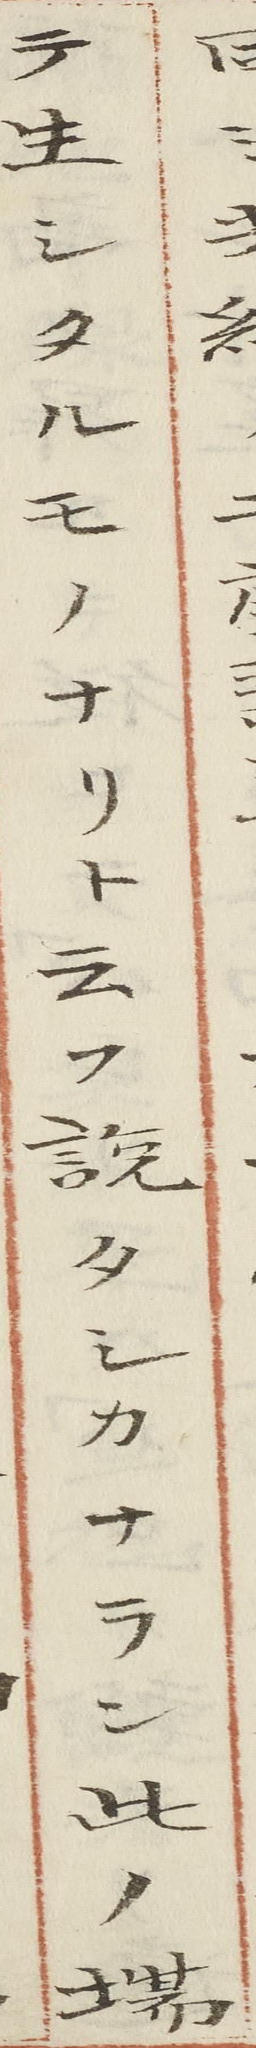テ生シタルモノナリト云フ説タシカナラン此ノ場
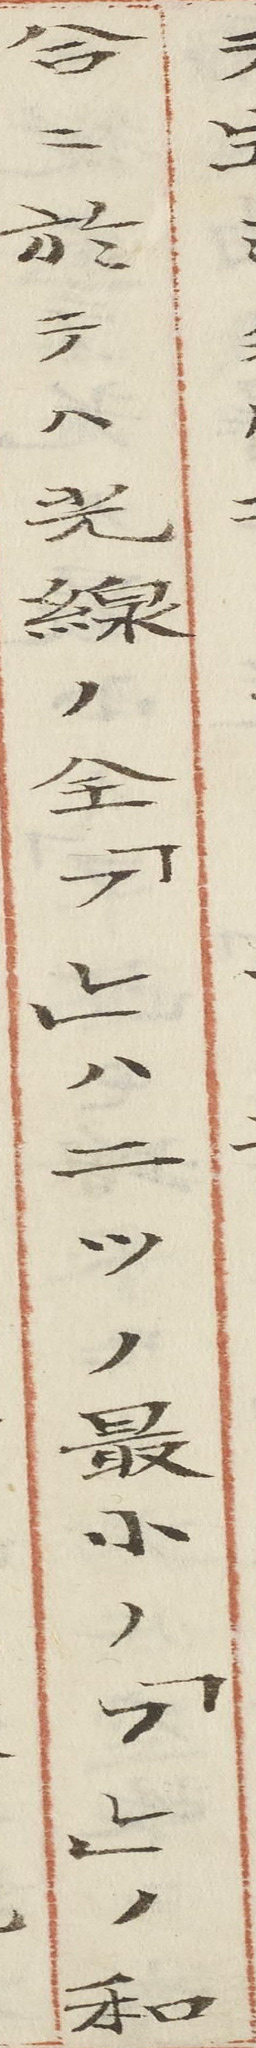合ニ於テハ光線ノ全「フレ」ハ二ツノ最小ノ「フレ」ノ和
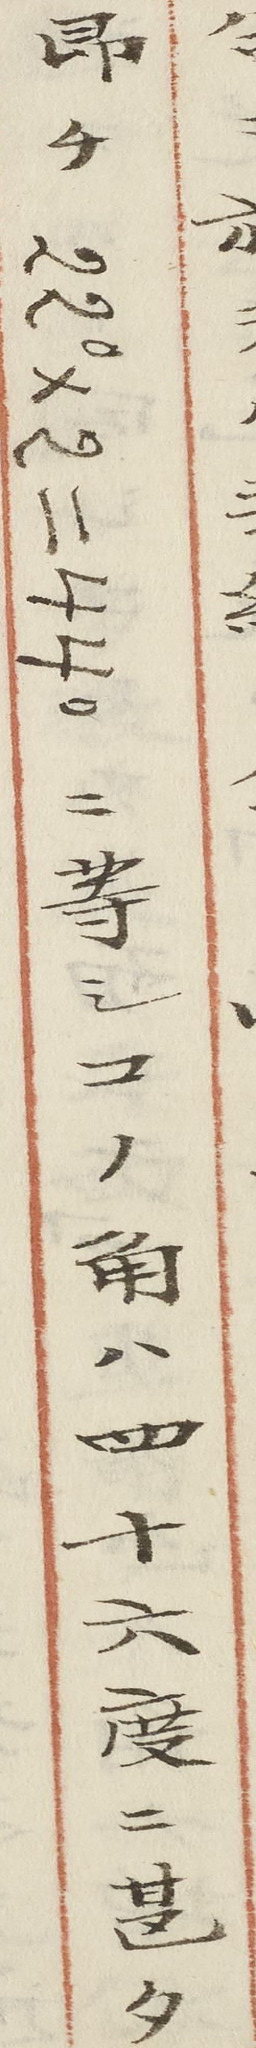即チ。×＝。ニ等シコノ角ハ四十六度ニ甚タ
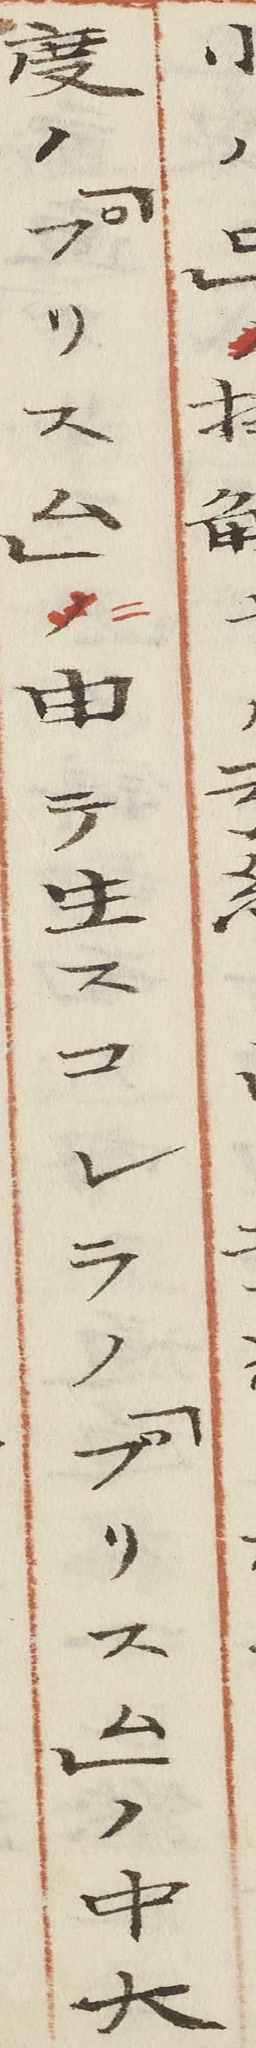度ノ「プリスム」ニ由テ生スコレラノ「プリスム」ノ中大
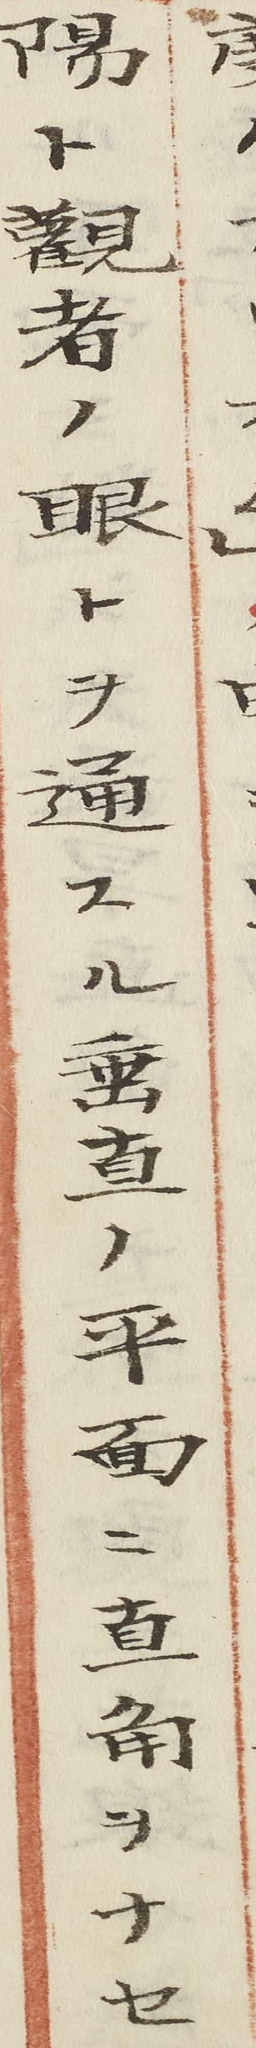陽ト観者ノ眼トヲ通スル垂直ノ平面ニ直角ヲナセ
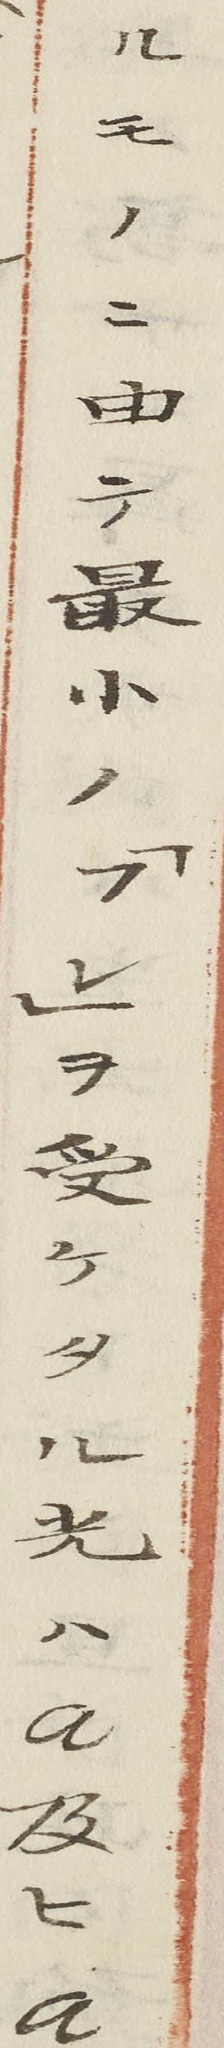ルモノニ由テ最小ノ「フレ」ヲ受ケタル光ハａ及ヒａ
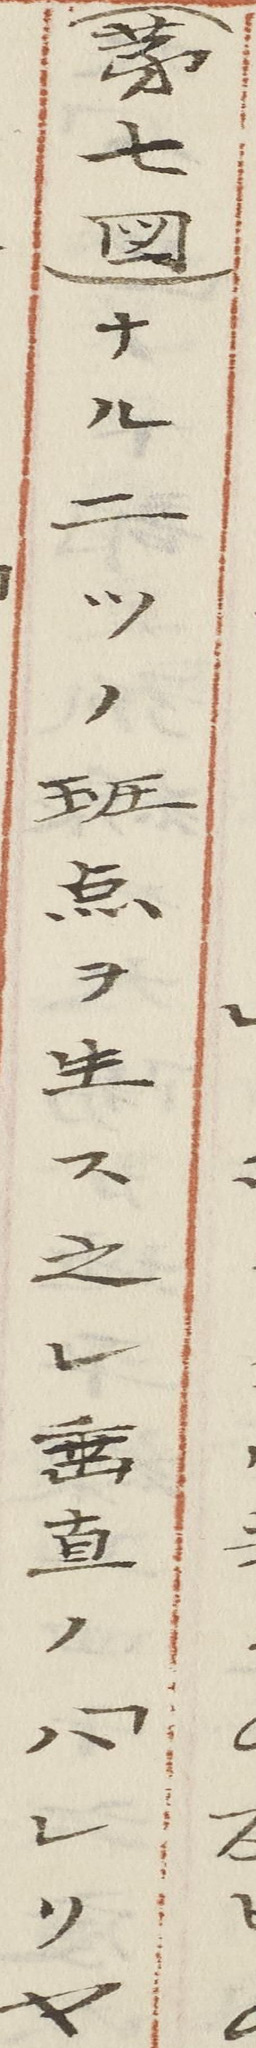ナル二ツノ斑点ヲ生ス之レ垂直ノ「ハレリヤ」
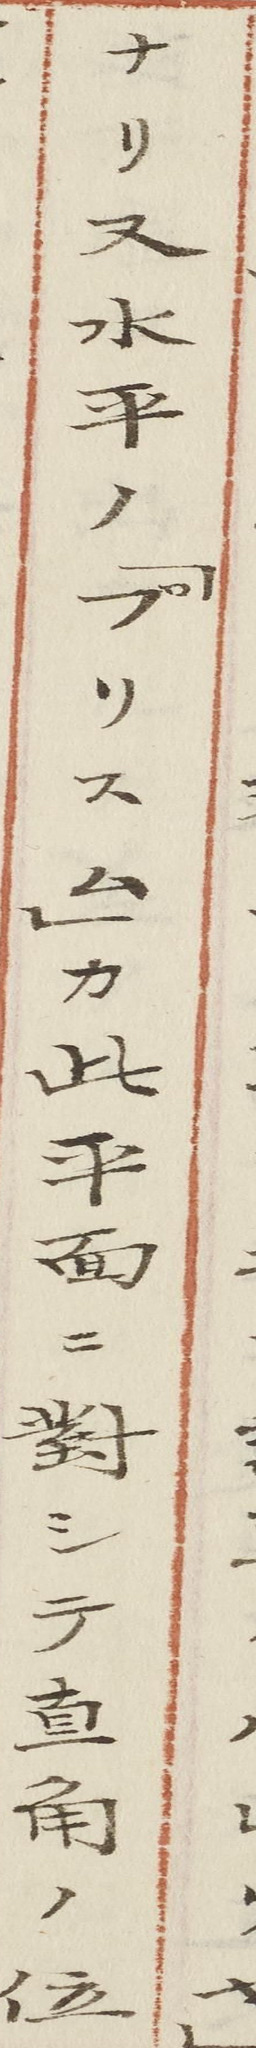ナリ又水平ノ「プリスム」カ此平面ニ対シテ直角ノ位
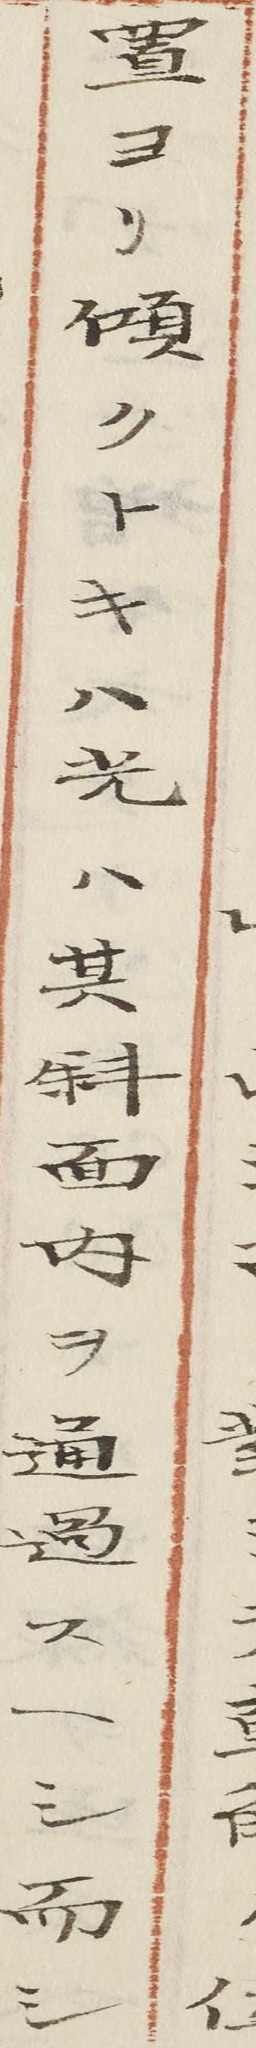置ヨリ傾クトキハ光ハ其斜面内ヲ通過スヘシ而シ
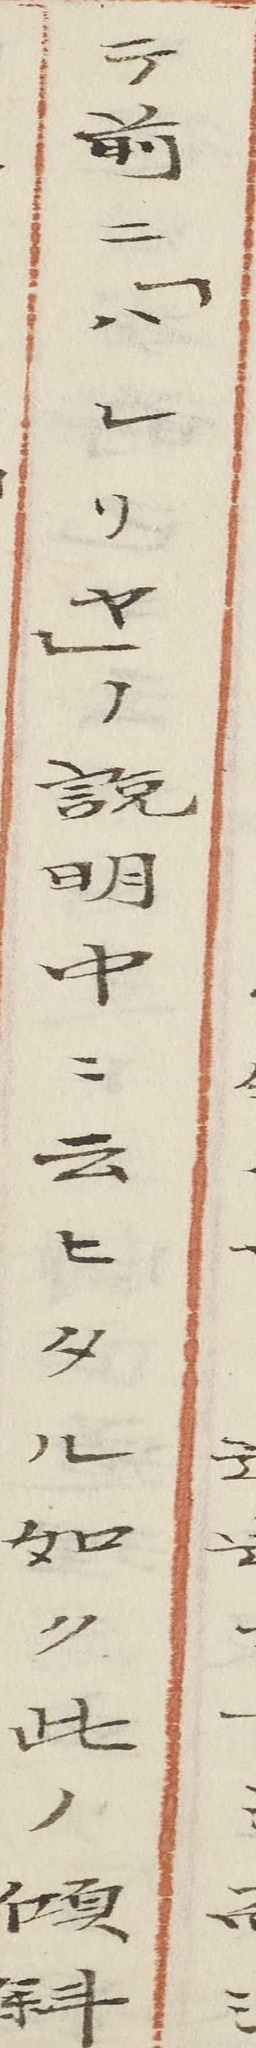テ前ニ「ハレリヤ」ノ説明中ニ云ヒタル如ク此傾斜
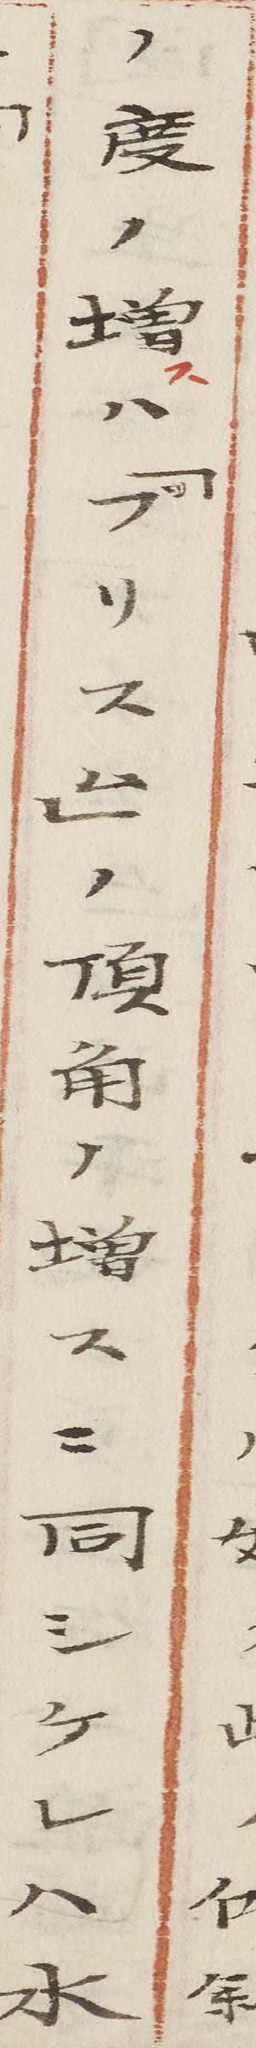ノ度ノ増スハ「プリスム」ノ頂角ノ増スニ同シケレハ水
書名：虹及ハロノ説明
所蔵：東京大学地震研究所図書室 Earthquake Research Institute Library, The University of Tokyo, JAPAN
